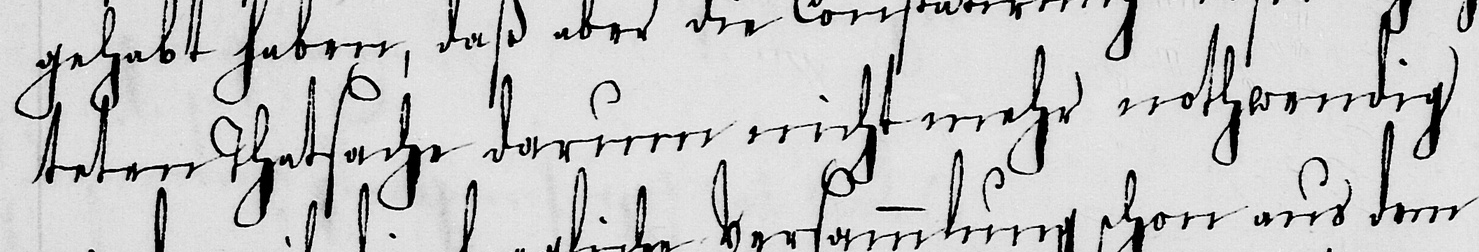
teten Thatsache darum nicht mehr nothwendig
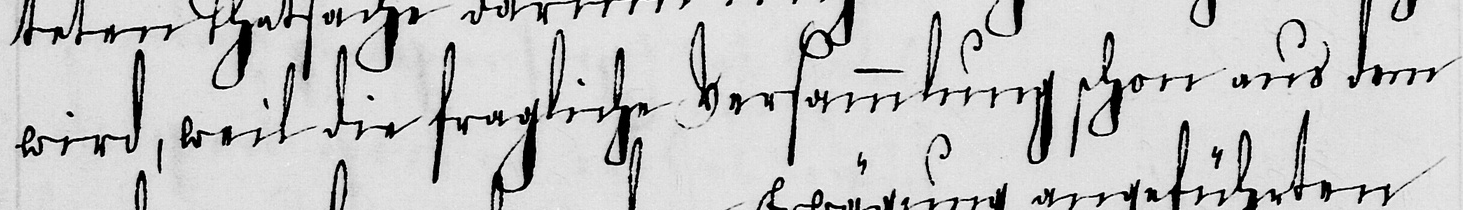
wird, weil die fragliche Versammlung schon aus dem
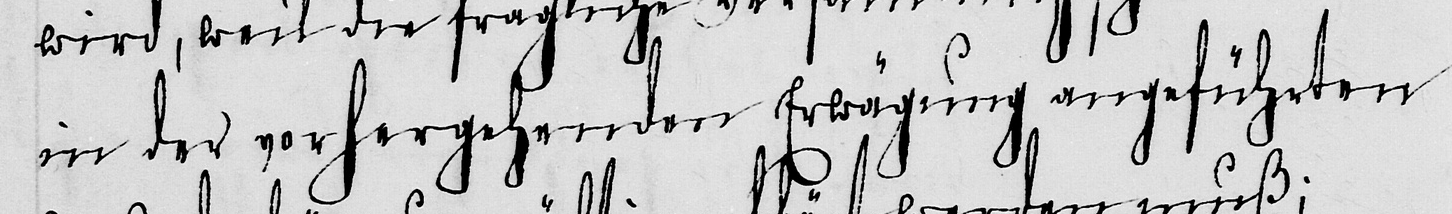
in der vorhergehenden Erwägung angeführten
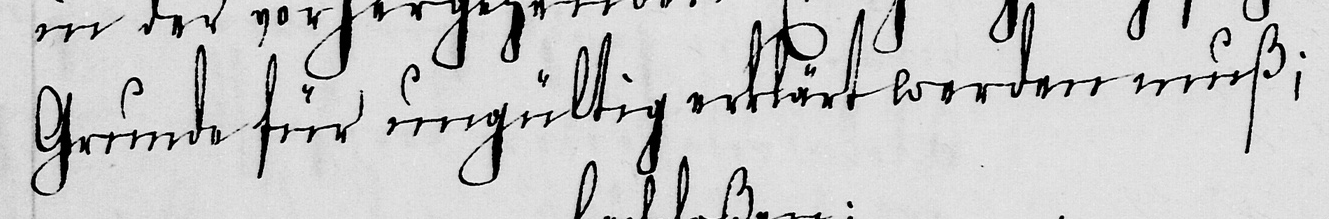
Grunde für ungültig erklärt werden muß;
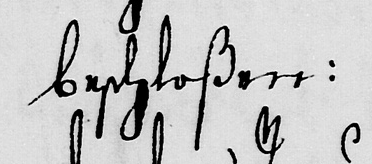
beschloßen:
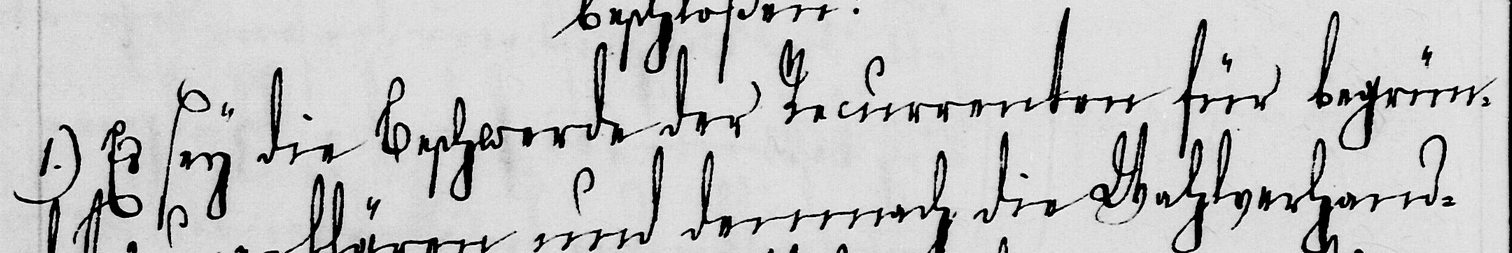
1.) Es sey die Beschwerde der Recurrenten für begrün¬
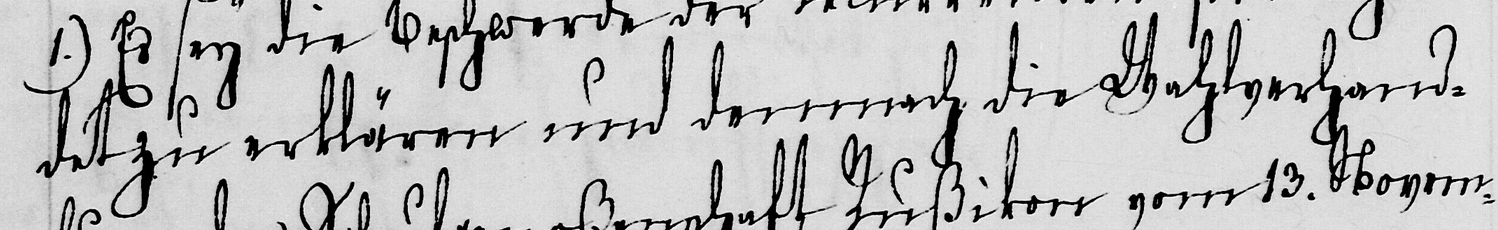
det zu erklären und demnach die Wahlverhand¬
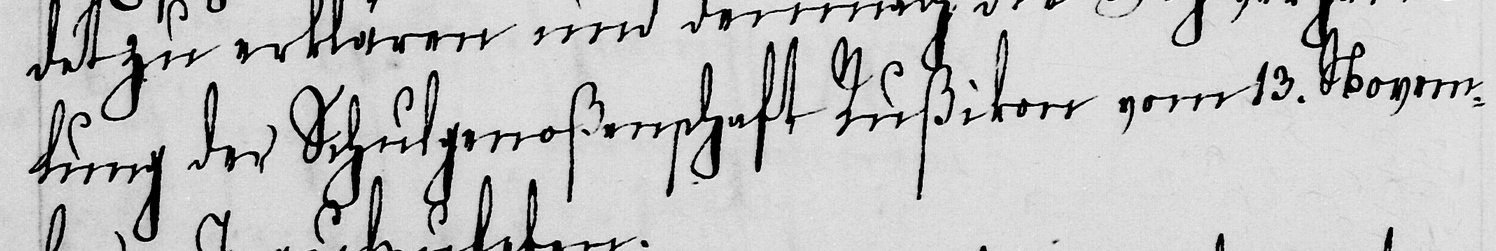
lung der Schulgenoßenschaft Rußikon vom 13. Novem¬
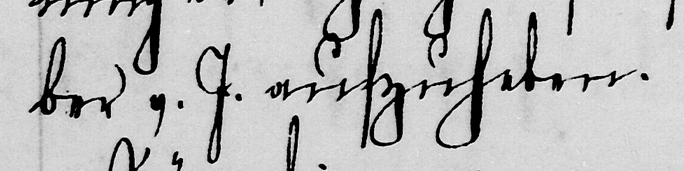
ber v. J. aufzuheben.
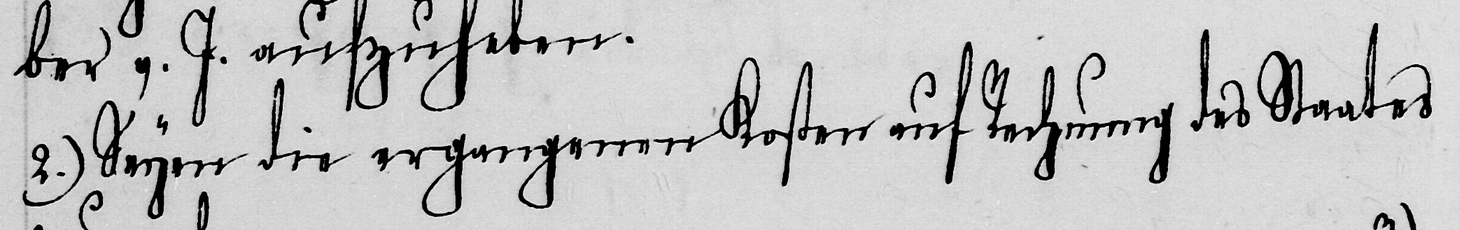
2.) Seyen die ergangenen Kosten auf Rechnung des Staates
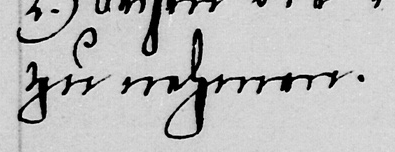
zu nehmen.
